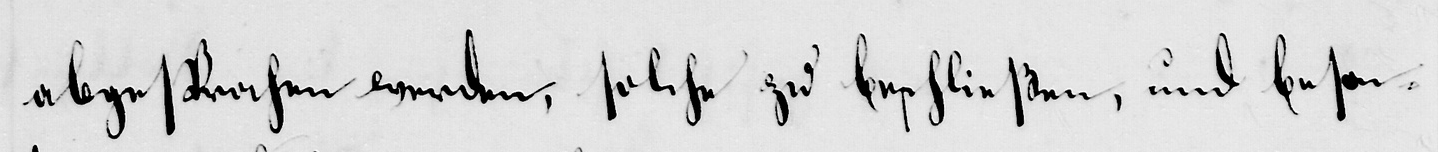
abgesprochen werden, solche zu beschließen, und beson¬
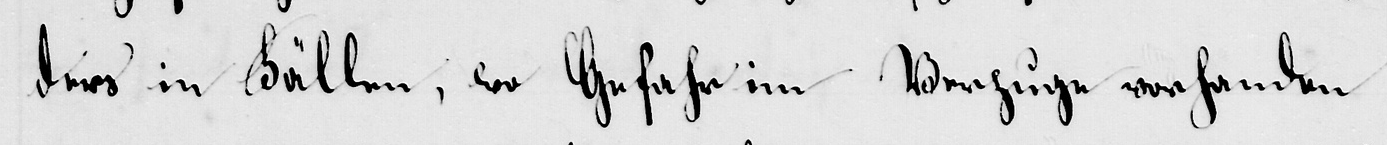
ders in Fällen, wo Gefahr im Verzuge vorhanden
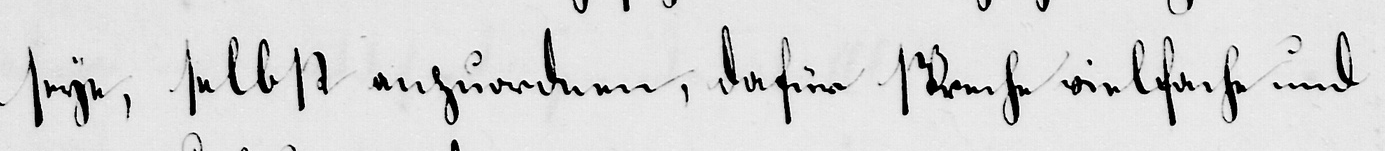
seye, selbst anzuordnen, dafür spreche vielfache und
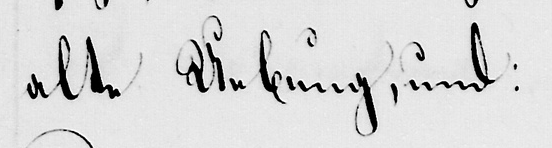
alte Uebung, und:
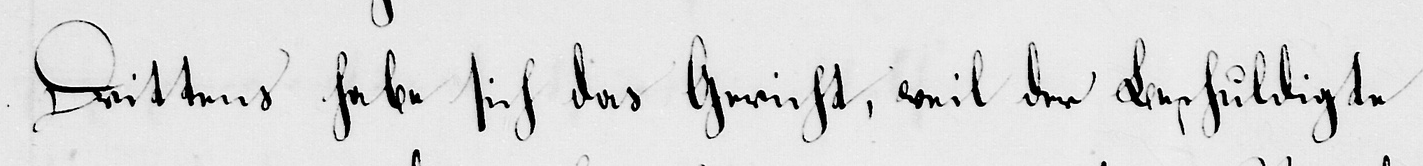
Drittens habe sich das Gericht, weil der Beschuldigte
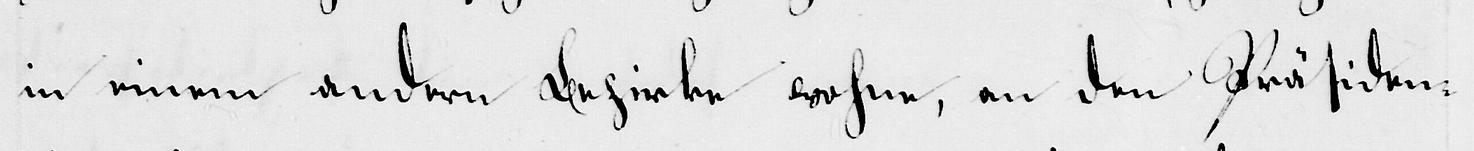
in einem andern Bezirke wohne, an den Präsiden¬
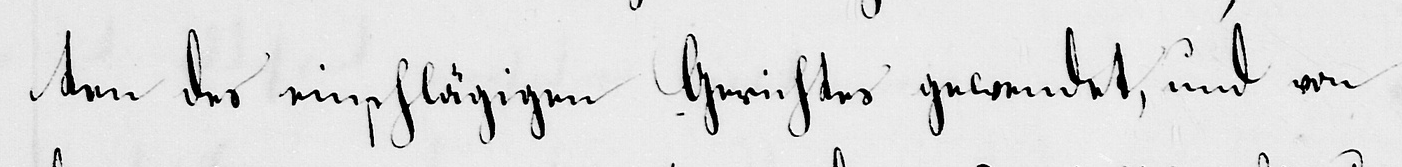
ten des einschlägigen Gerichtes gewendet, und von
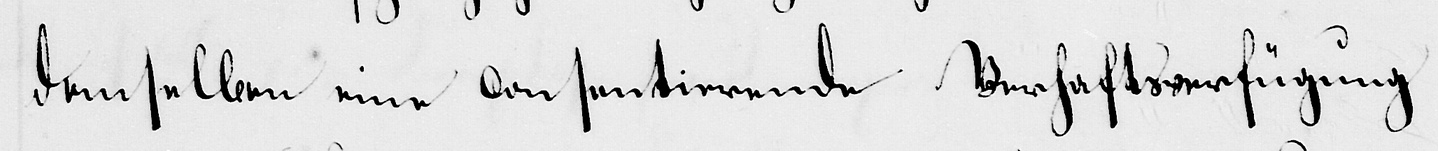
demselben eine consentierende Verhaftungsverfügung
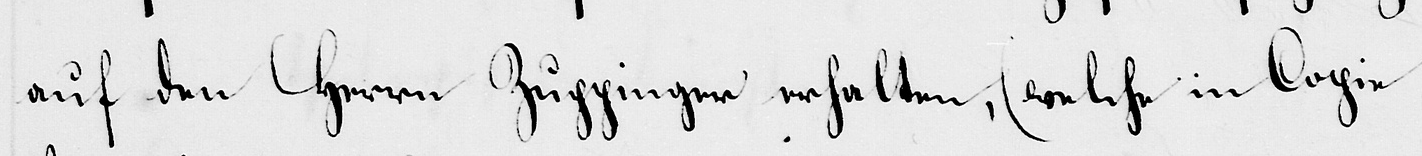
auf den Herrn Zuppinger erhalten, (welche in Copie
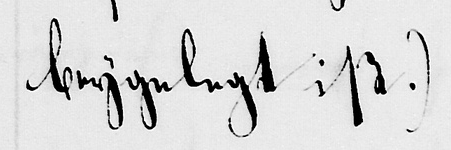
beygelegt ist.)
